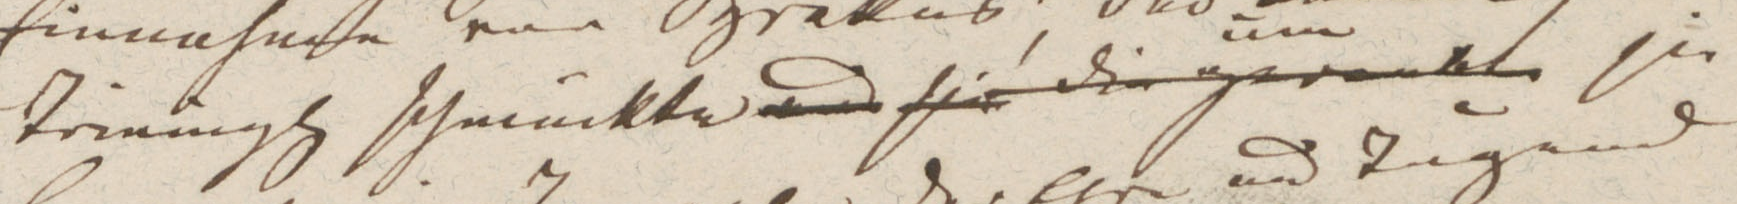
Triumph schmückte und sie die geraubte um sie
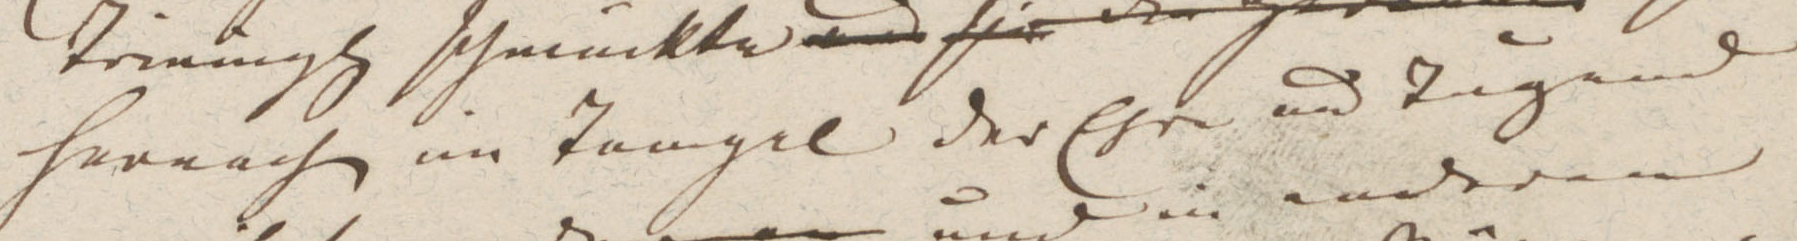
hernach im Tempel der Ehre und Tugend
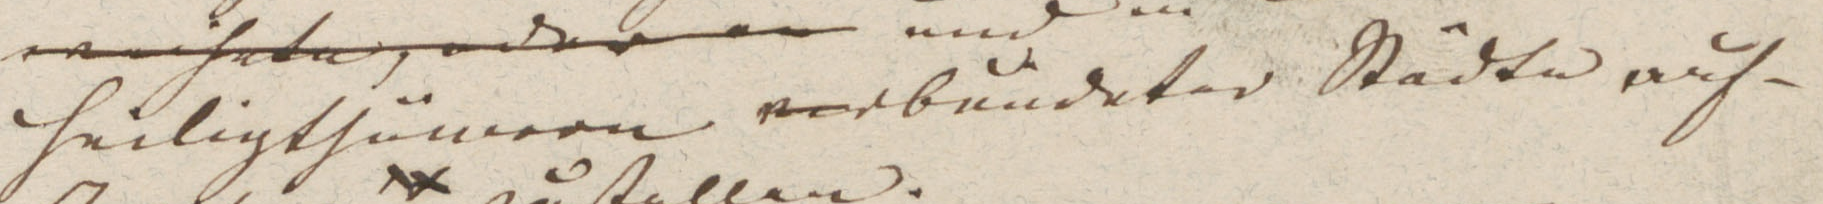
Heiligthümern verbündeter Ständte auf-
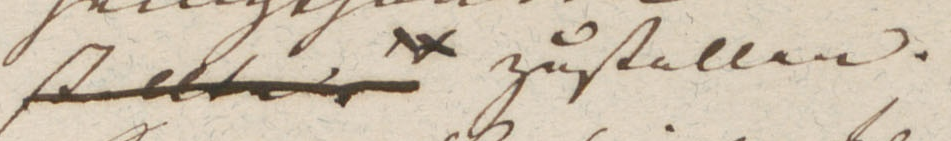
stellte% zustellen.
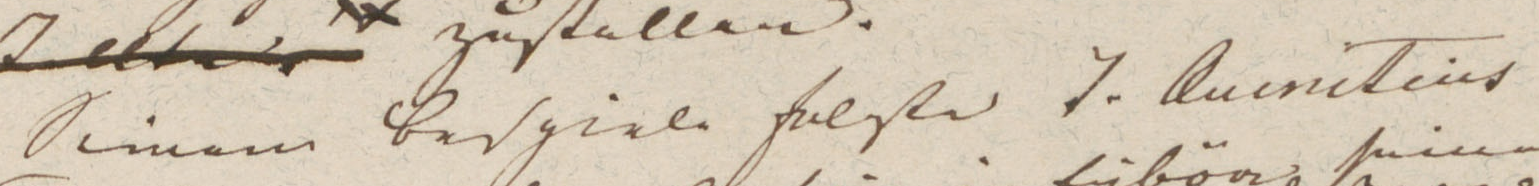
Seinem Beispiele folgte T. Quintius
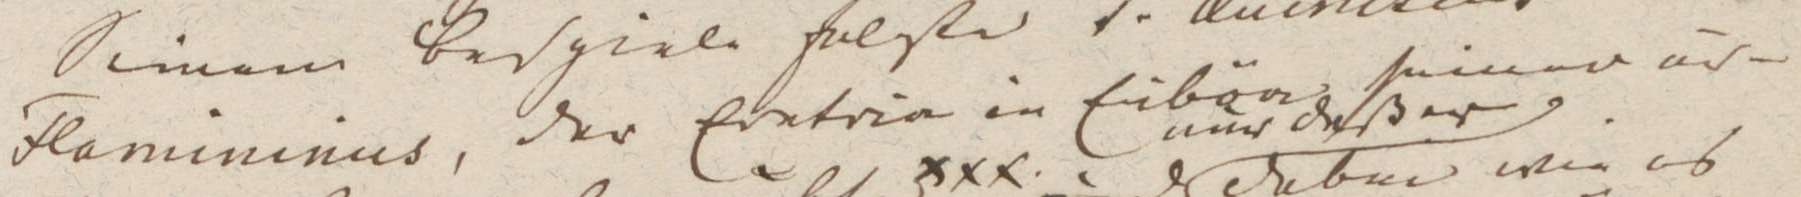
Flamininus, der Eretria in Euböa seiner ur-
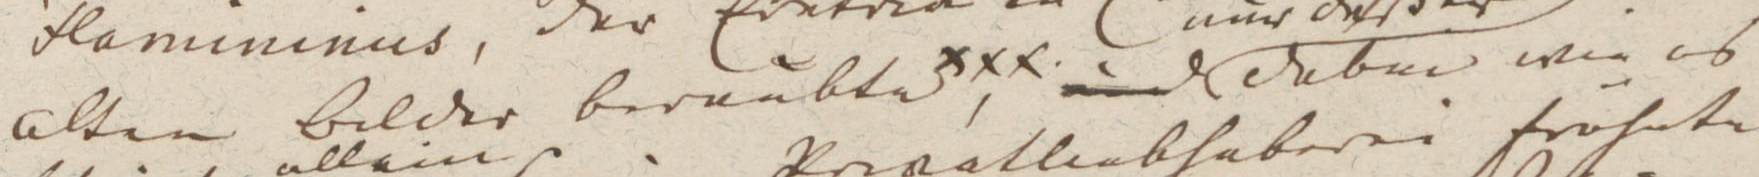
alten Bilder beraubte, % und nur dass er dabei wie es
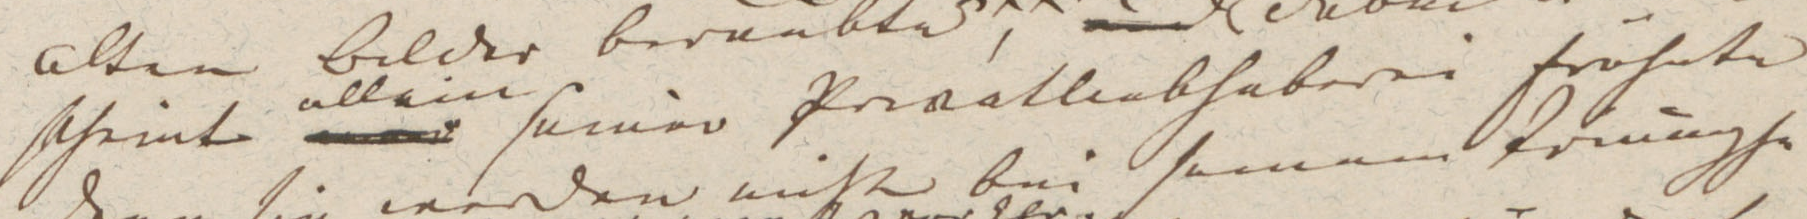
scheint allein seiner Privatliebhaberei fröhnte
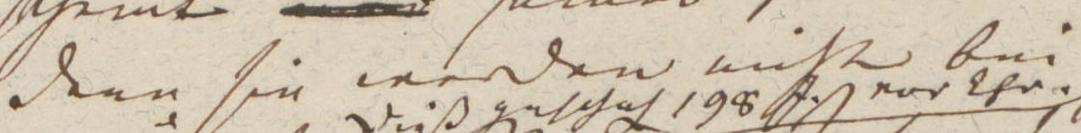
denn sie werden nicht bei
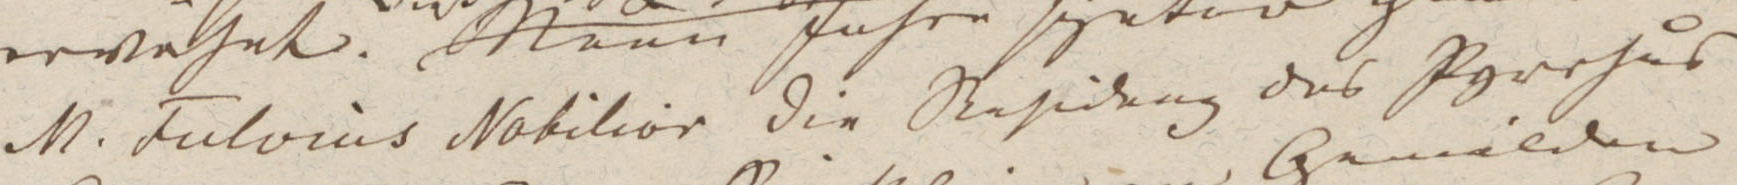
M. Fulvius Nobilior die Residenz des Pyrrhus
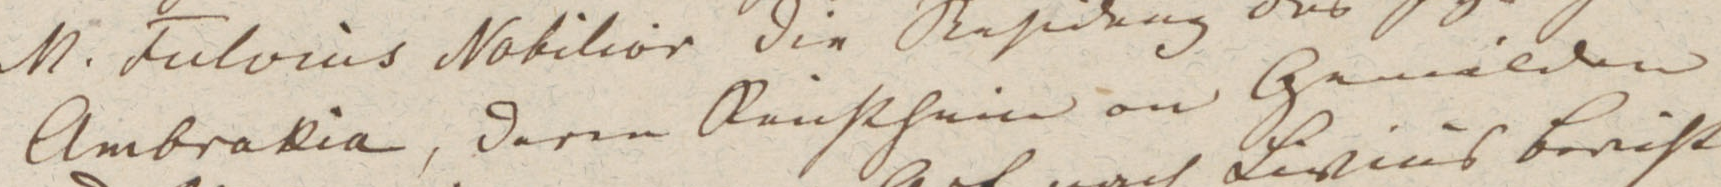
Ambrakia, deren Reichthum an Gemälden
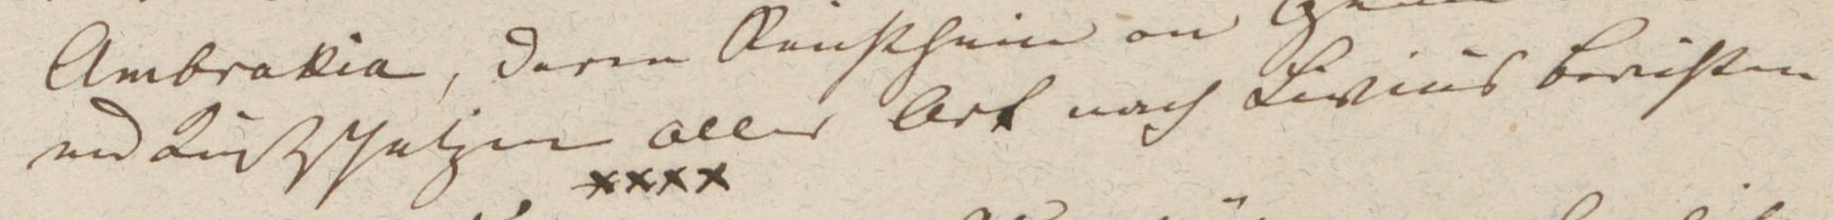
und Kunstschätzen aller Art nach Livius Berichten
